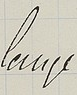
nach
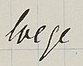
Berlin
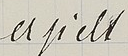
nach meiner
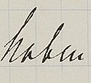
über
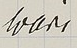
terhandlung
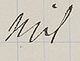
Aus-
